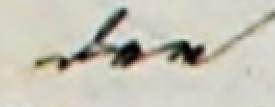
den
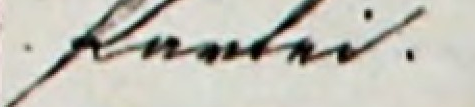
Partei.
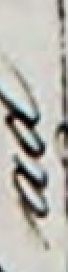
ad
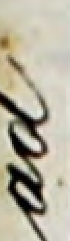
ad
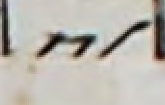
???
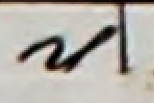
???
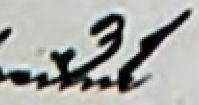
31
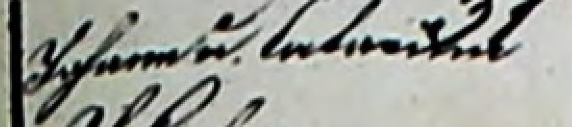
Johann u. Calarina
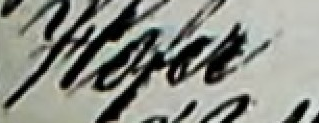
Hofer
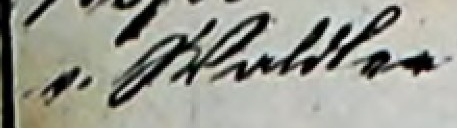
v. Waldler
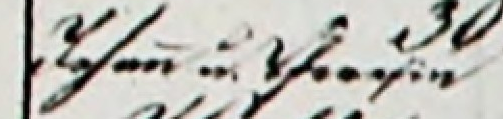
Johann u. Theresia
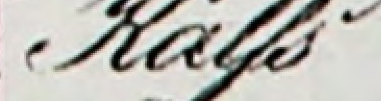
Kalfs
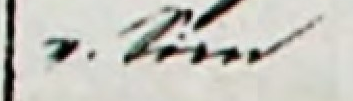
v. Sim
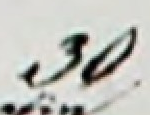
30
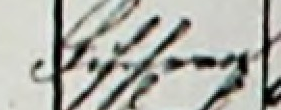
Fischern„
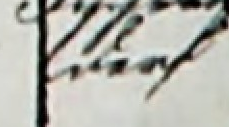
dorf
